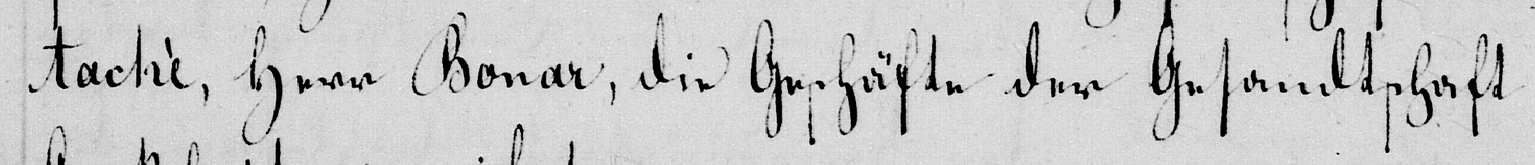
taché, Herr Bonar, die Geschäfte der Gesandtschaft
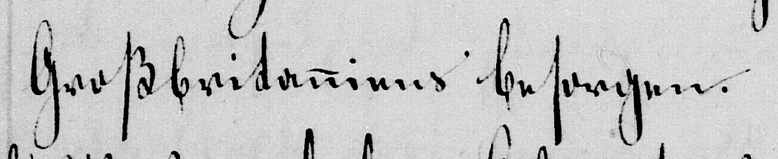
Großbritanniens besorgen.
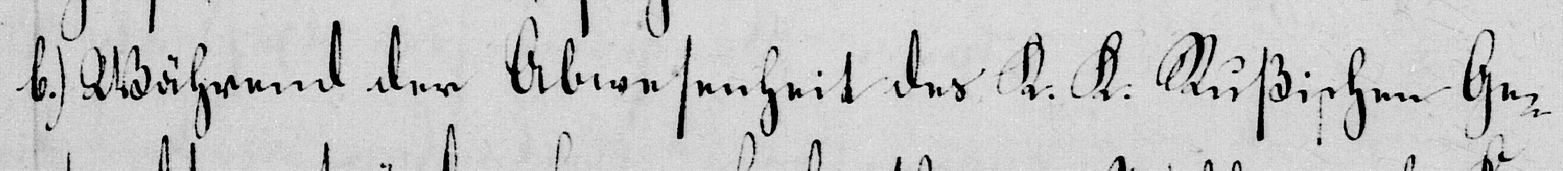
b.) Während der Abwesenheit des K. K. Rußischen Ge¬
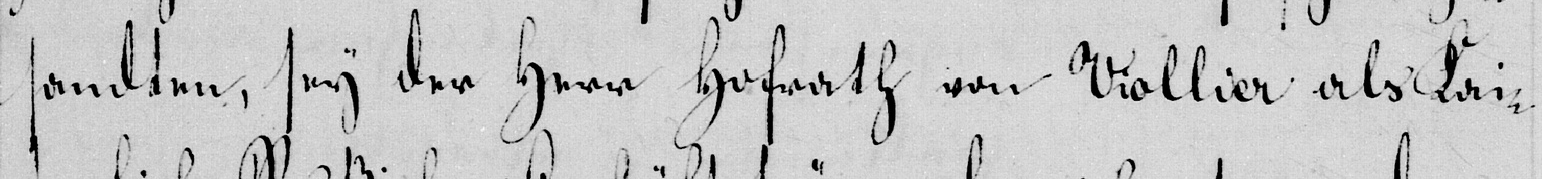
sandten, sey der Herr Hofrath von Viollier als Kai¬
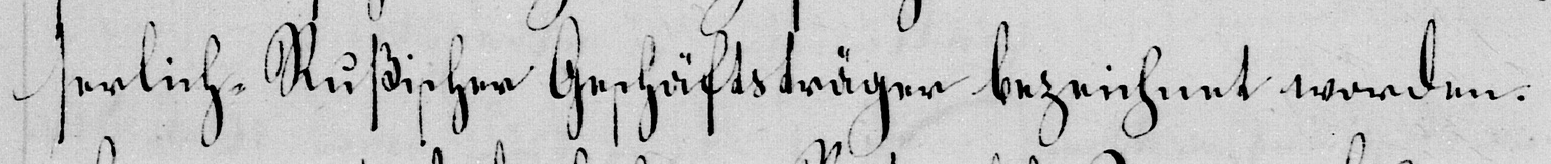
serlich-Rußischer Geschäftsträger bezeichnet worden.
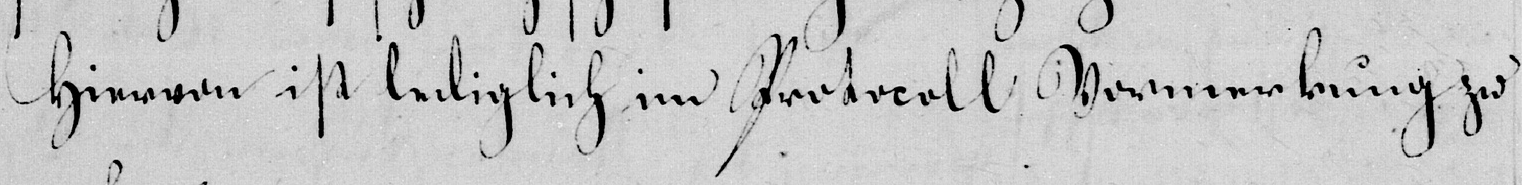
Hiervon ist lediglich im Protokoll Vormerkung zu
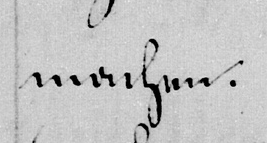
machen.
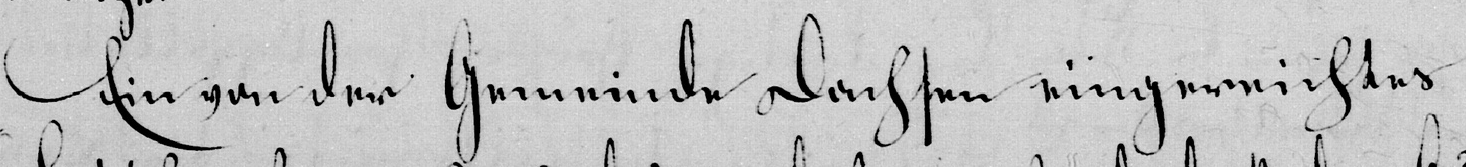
Ein von der Gemeinde Dachsen eingereichtes
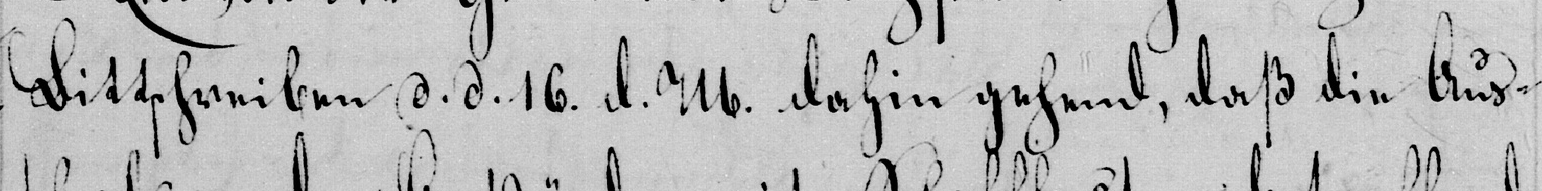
Bittschreiben d. d. 16. d. M. dahin gehend, daß die Aus¬
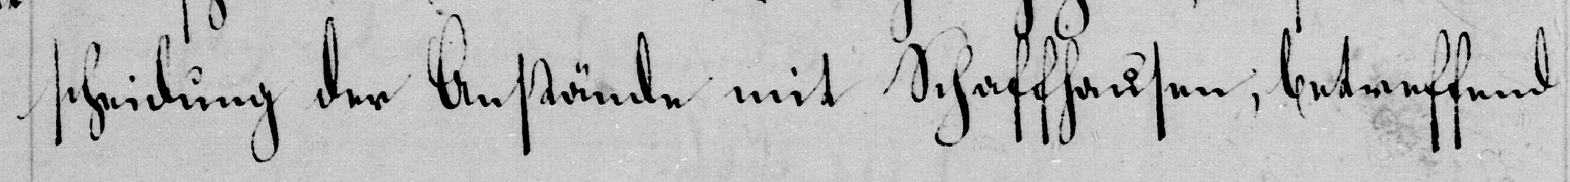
scheidung der Anstände mit Schaffhausen, betreffend
